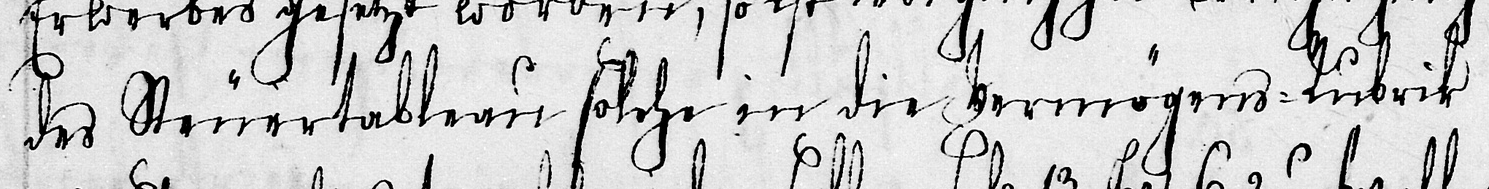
des Steuertableau solche in die Vermögens-Rubrik
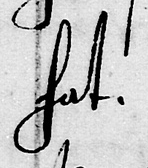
hat.
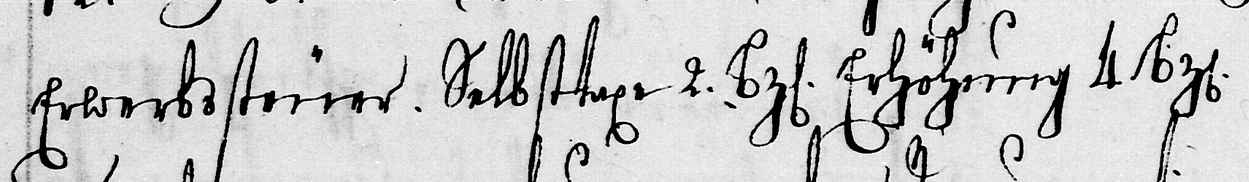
Erwerbssteuer. Selbsttaxe 2. Bz[en]. Erhöhung
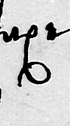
4.
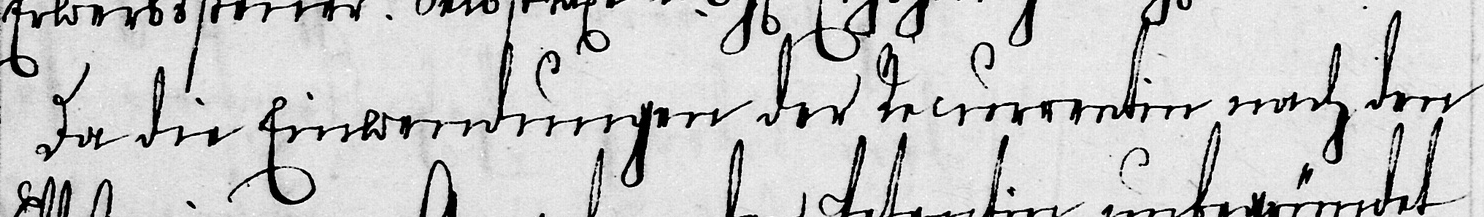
Da die Einwendungen der Recurrentin nach den
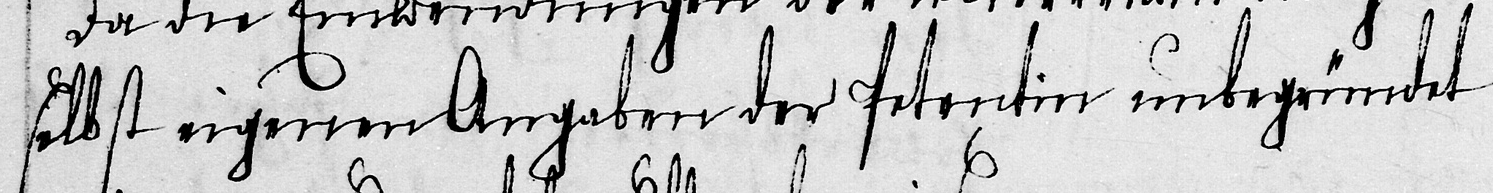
selbst eigenen Angaben der Petentin unbegründet
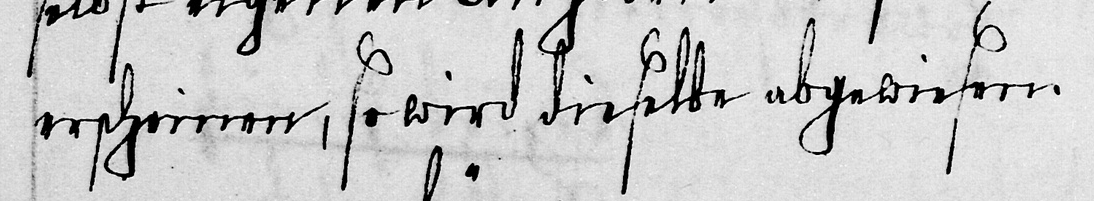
erscheinen, so wird dieselbe abgewiesen.
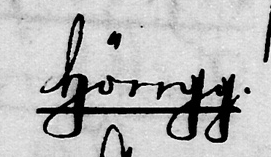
Höngg.
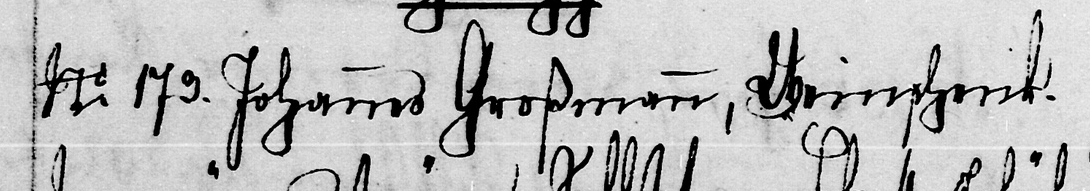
No. 173. Johannes Großmann, Weinschenk.
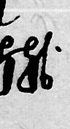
22.
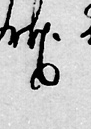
5.
